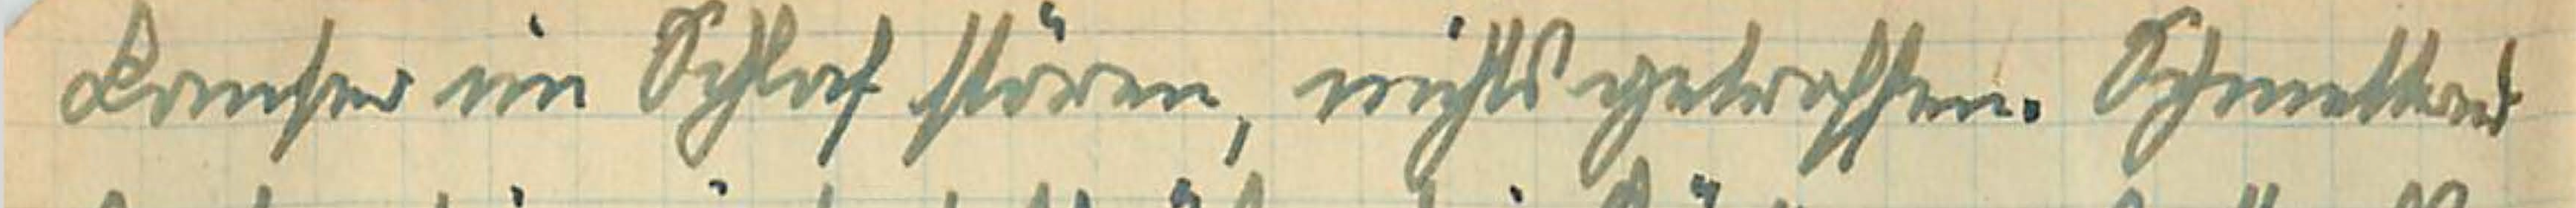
Lanser im Schlaf stören, nichts getroffen. Schmetternd
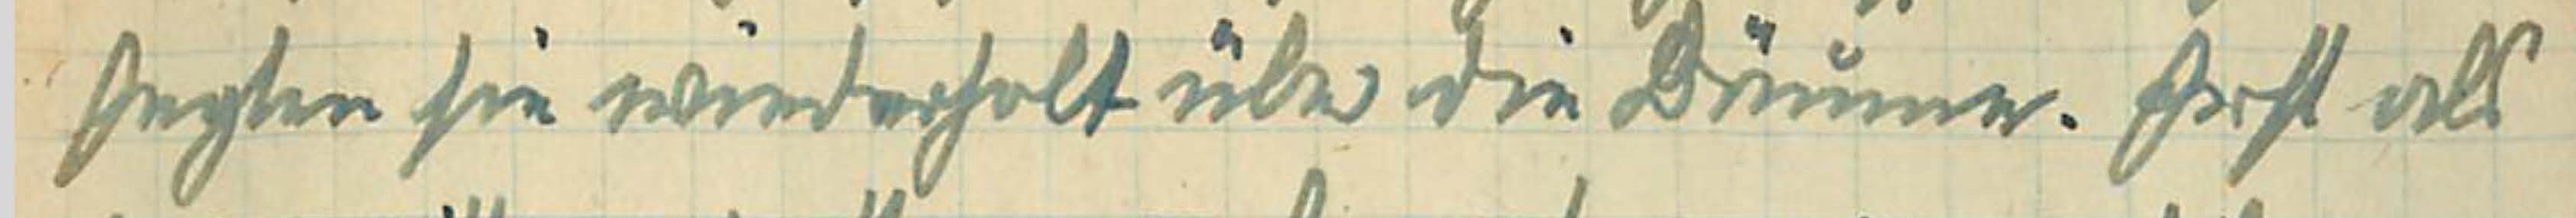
fegten sie wiederholt über die Bäume. Erst als
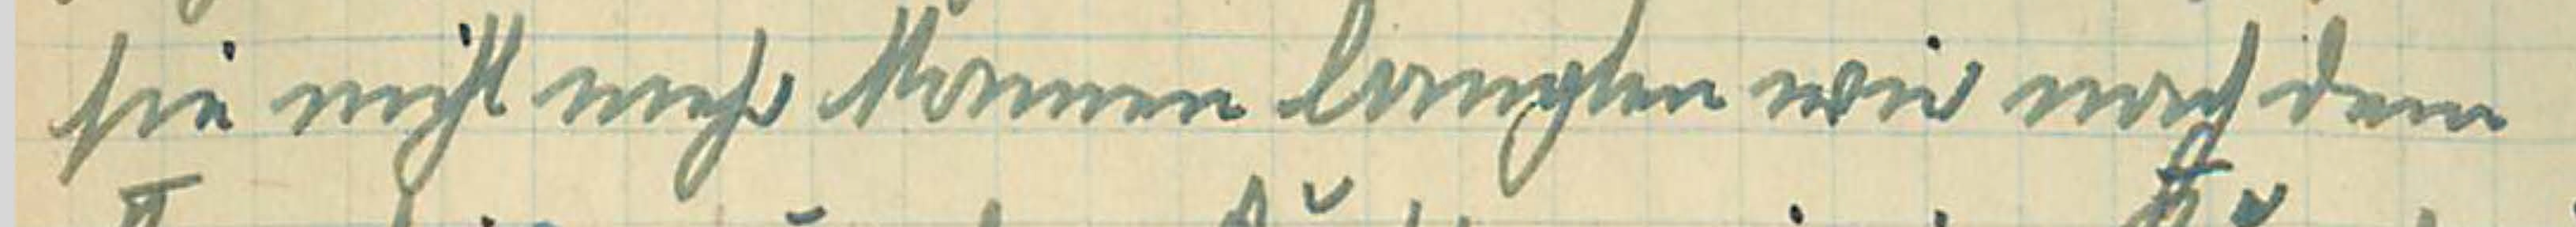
sie nicht mehr kamen langten wir nach dem
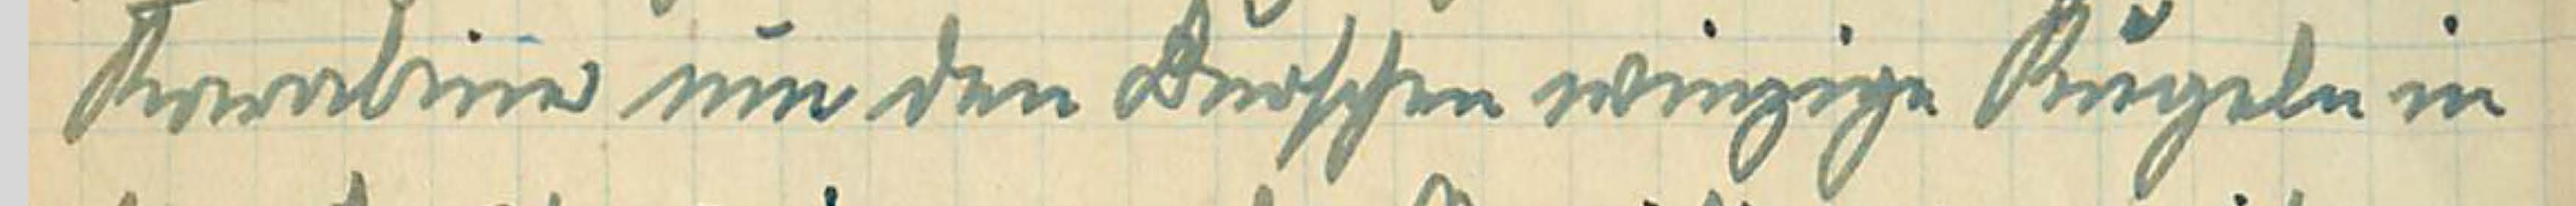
Karabiner um den Burschen winzige Kugeln in
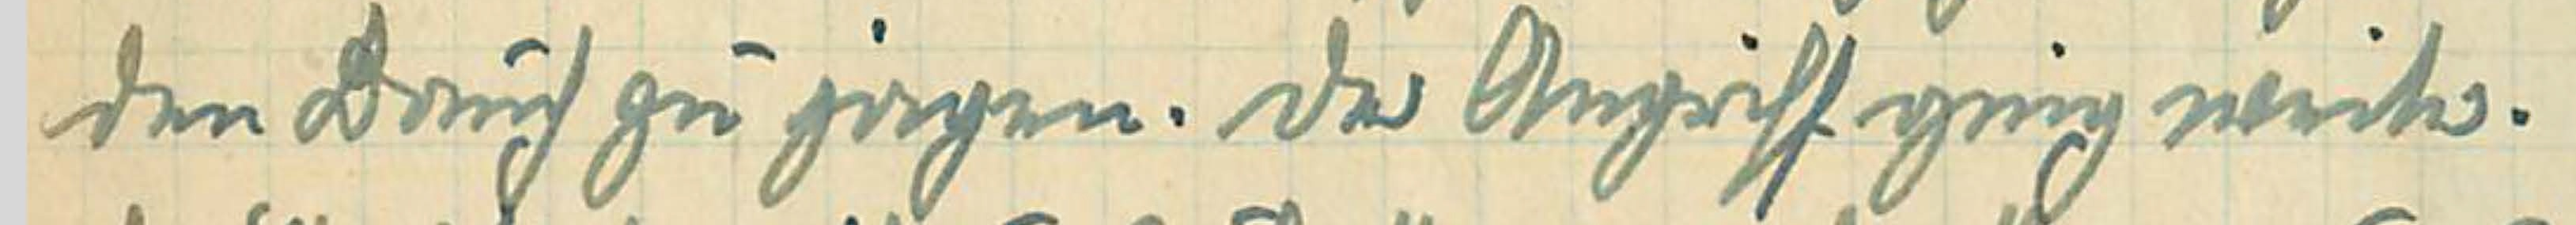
den Bauch zu jagen. Der Angriff ging weiter.
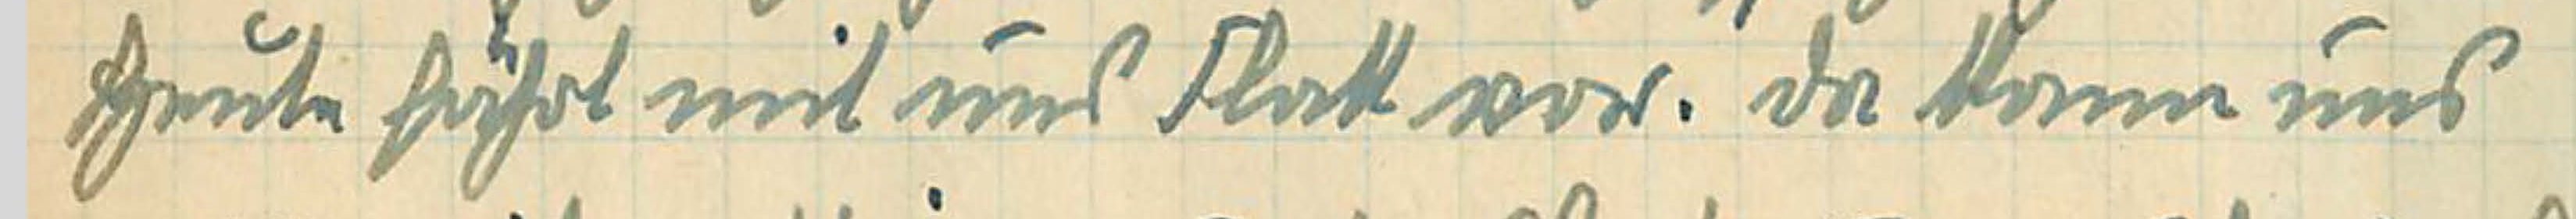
Heute fährt mit uns Flak vor. Da kann uns
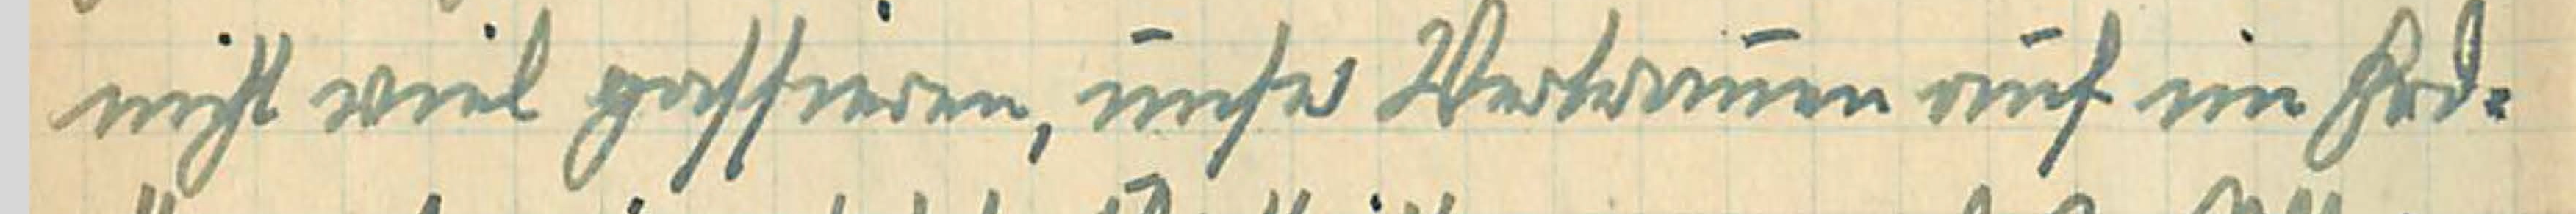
nicht viel passieren, unser Vertrauen auf im Erd-
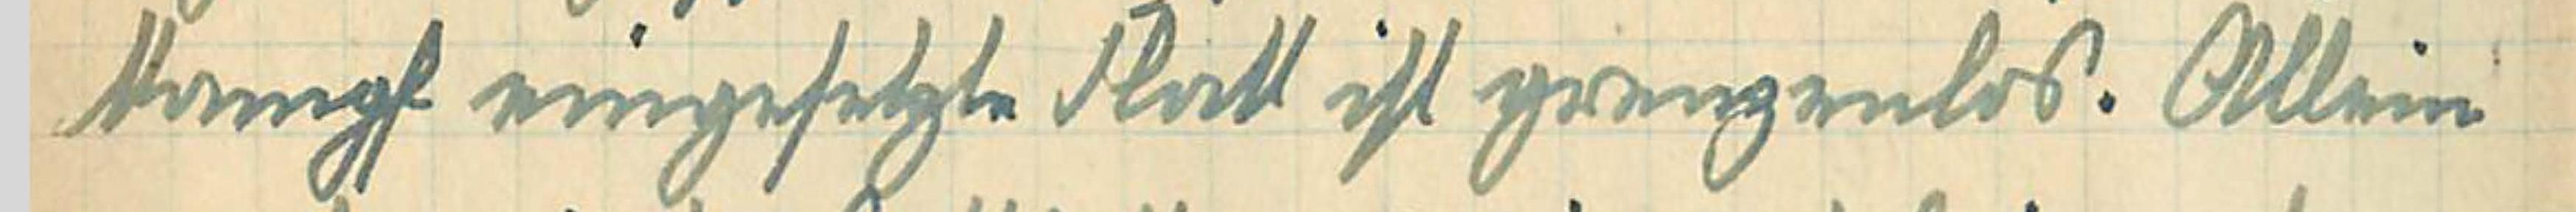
kampf eingesetzte Flak ist grenzenlos. Allein
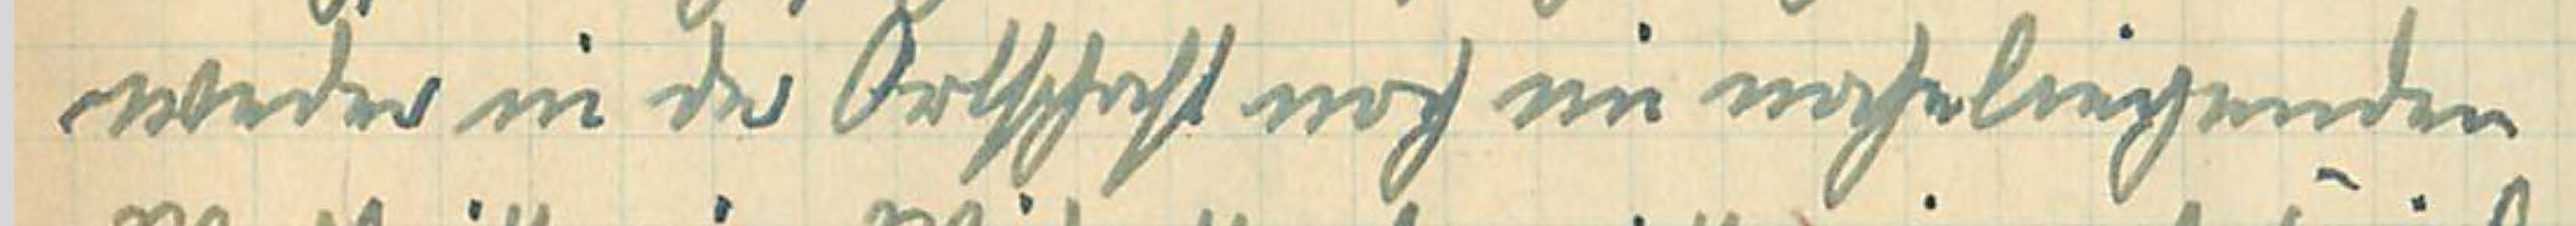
weder in der Ortschaft noch im naheliegenden
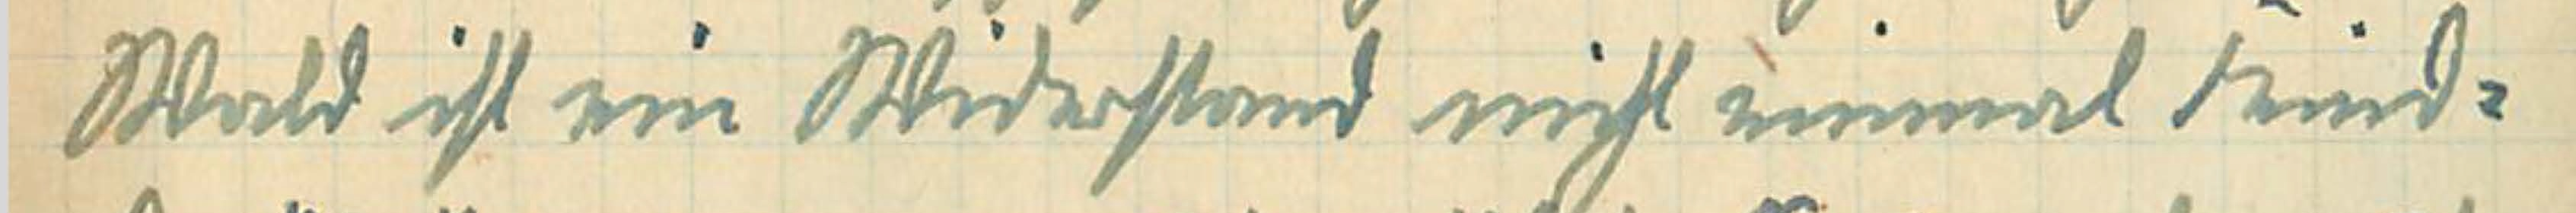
Wald ist ein Widerstand nicht einmal Feind-
